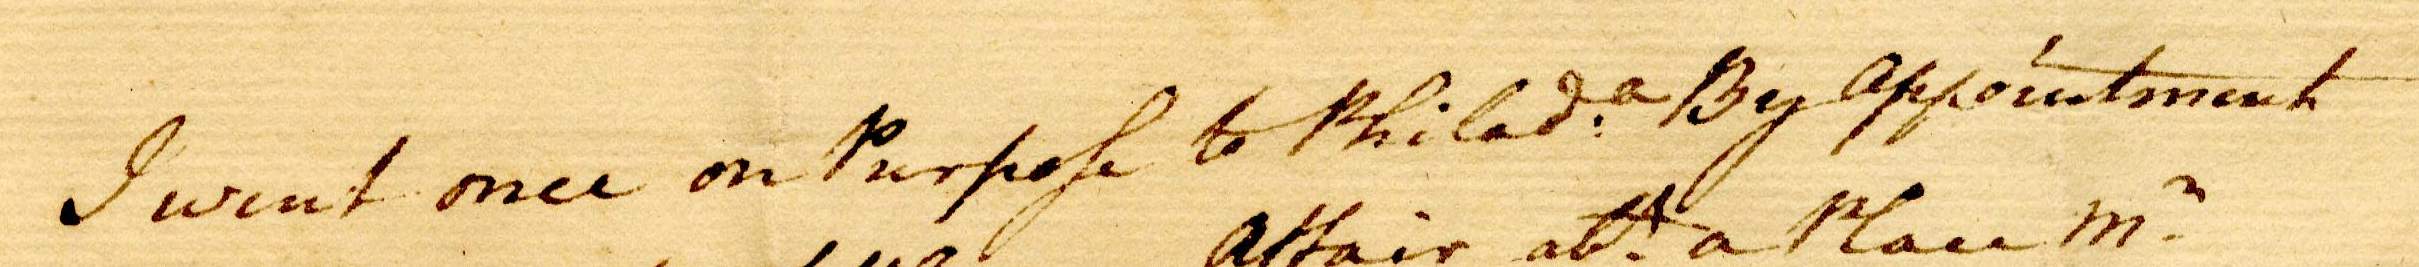I went once on Purpose to Philad^a: By Appointment
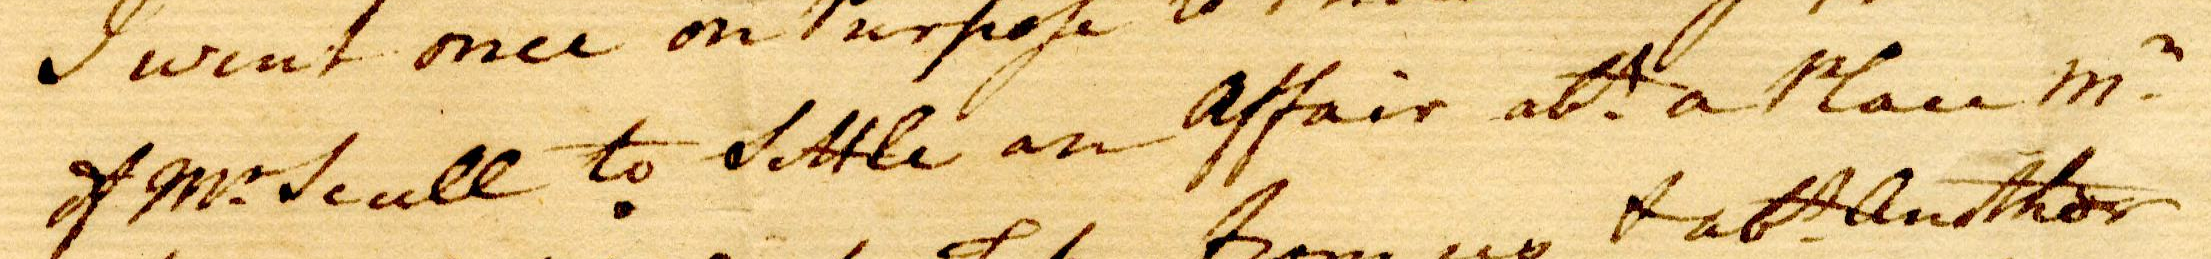of M^r. Scull to settle an affiar ab^t. a Place M^r.
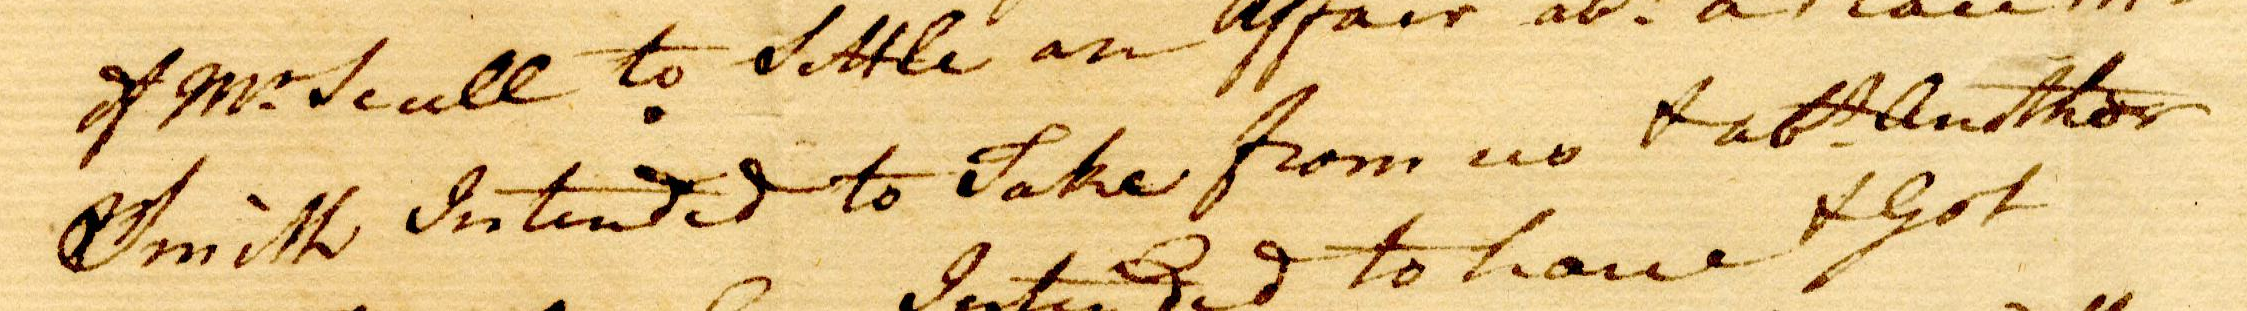Smith Intended to Take from us & ab^t. Another
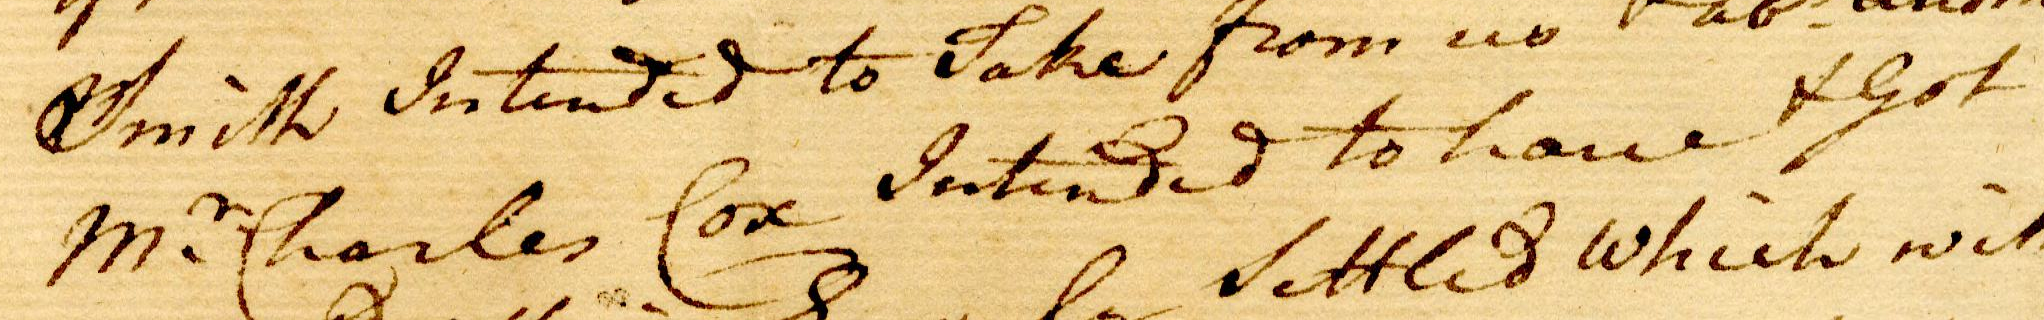M^r. Charles Cox Intended to have & Got
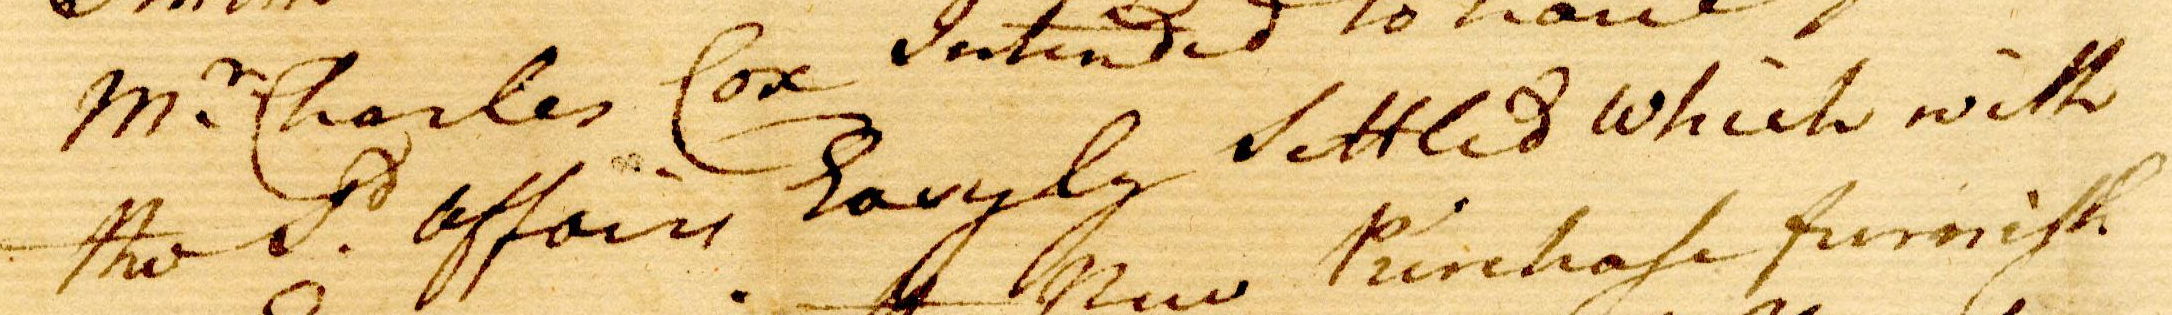the S^d. affais Easyly settled which with
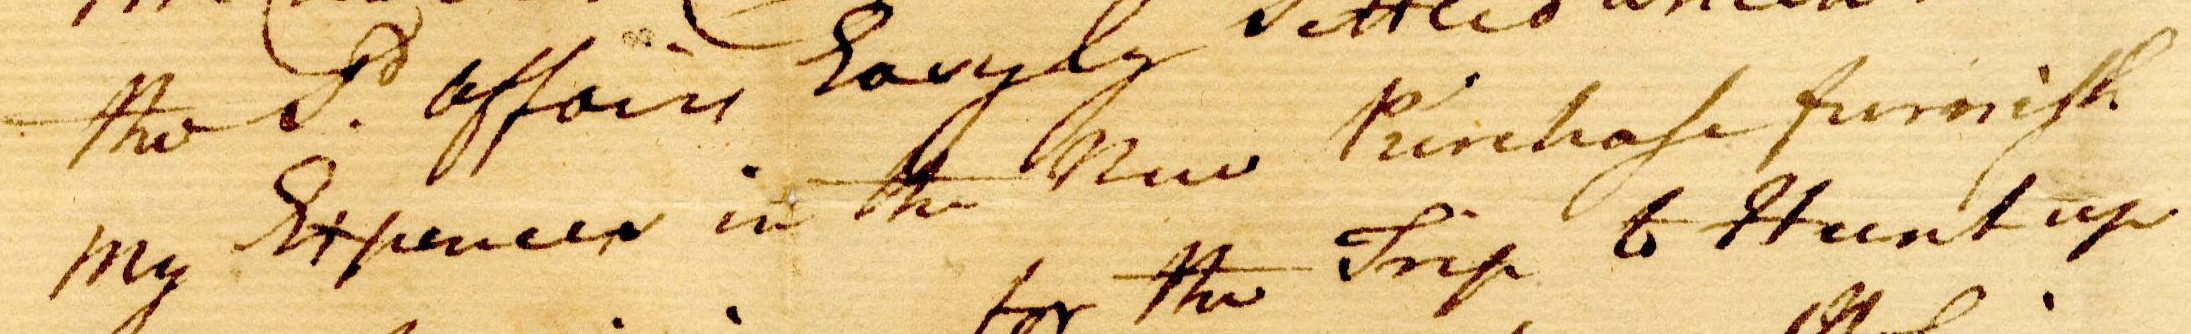my Expences in the New Prcahse furnish
